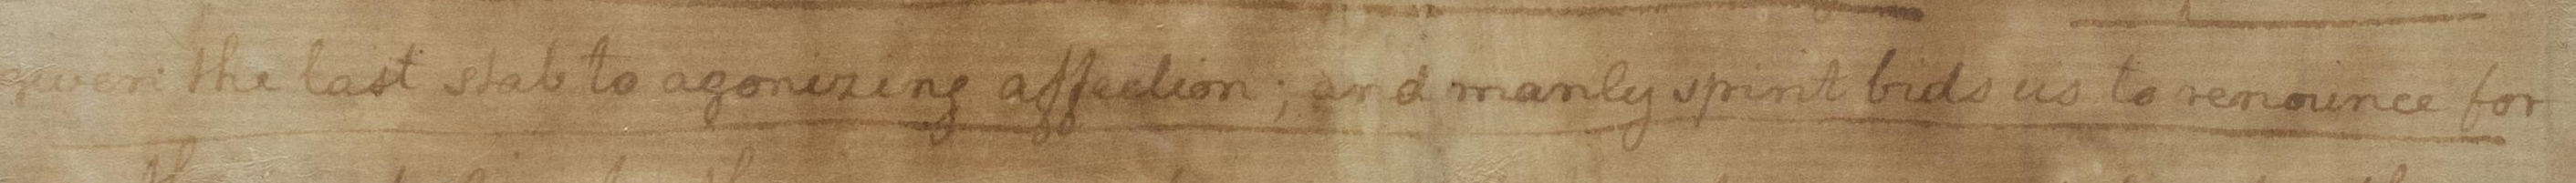given the last stab to agonizing affection; and manly spirit bids us to renounce for-
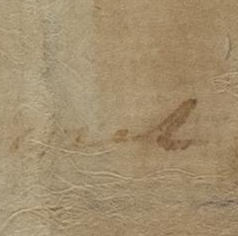out
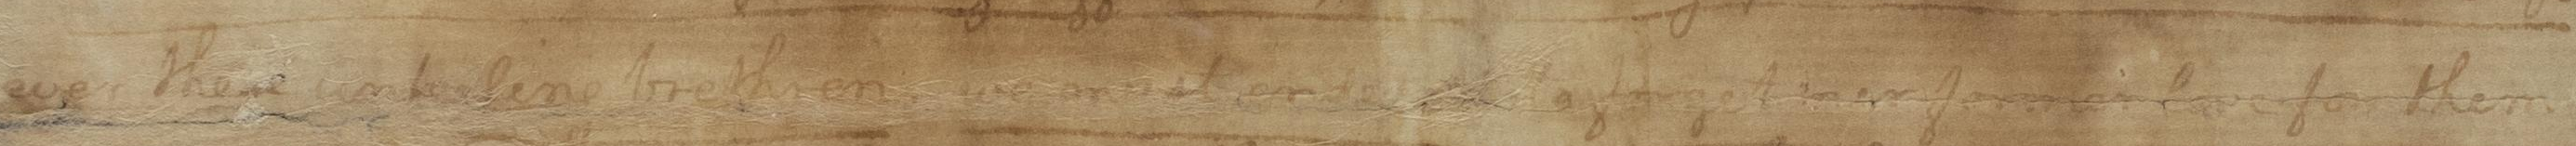-ever these unfeeling brethren we must endeavor to forget our former love for them
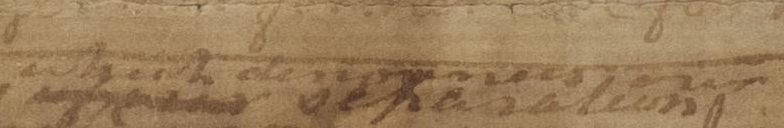which denounces our
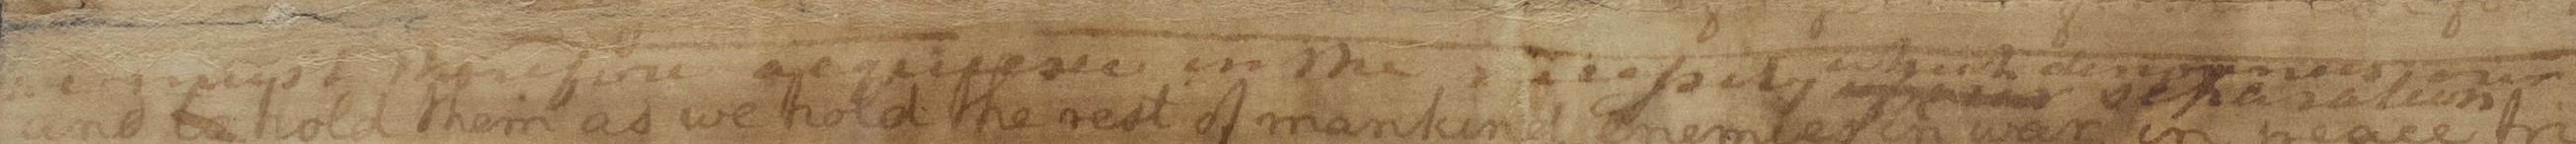we must therefore acquiesce in the necessity [_____] Separation,
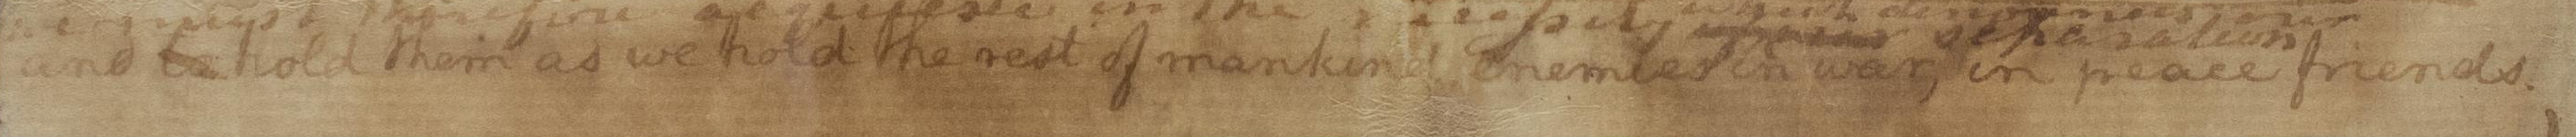and to hold them as we hold the rest of mankind, enemies in war, in peace friends.
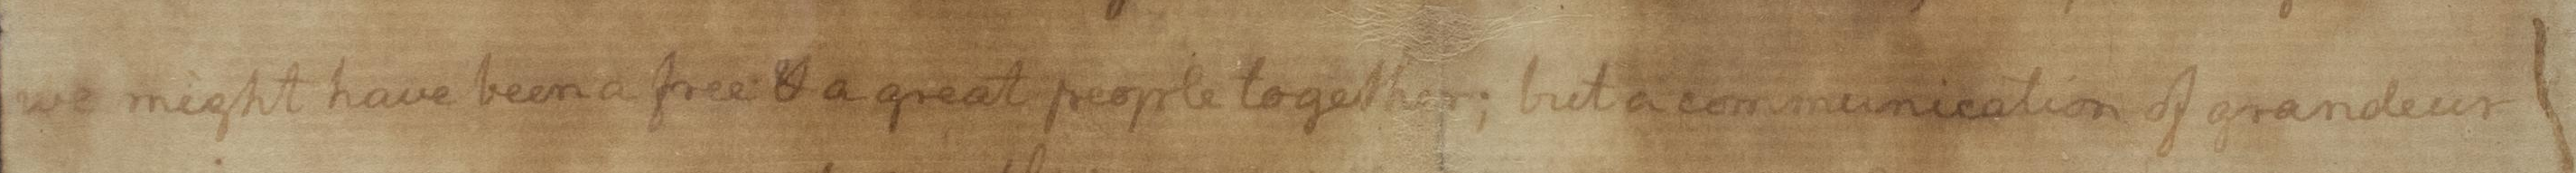we might have been a free & great people together; but a communication of grandeur
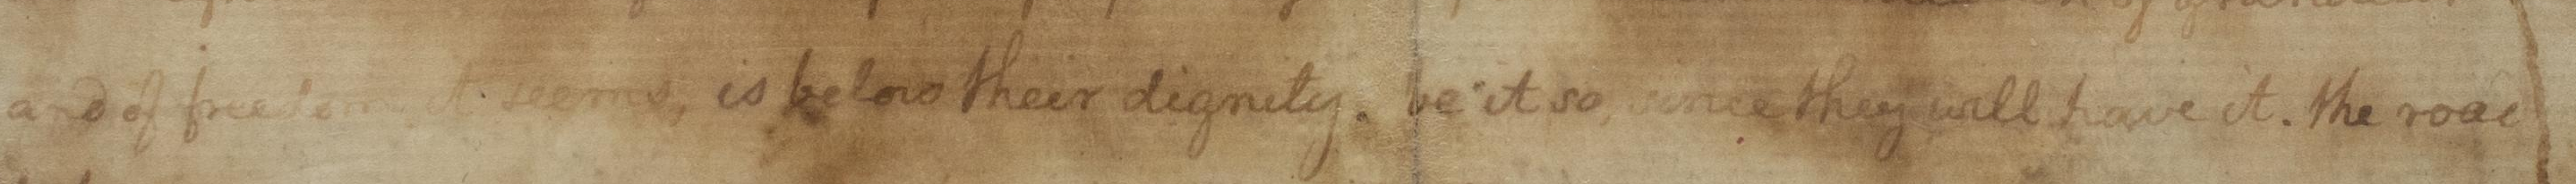of freedom it seems is below their dignity. be it so, since they will have it: the road
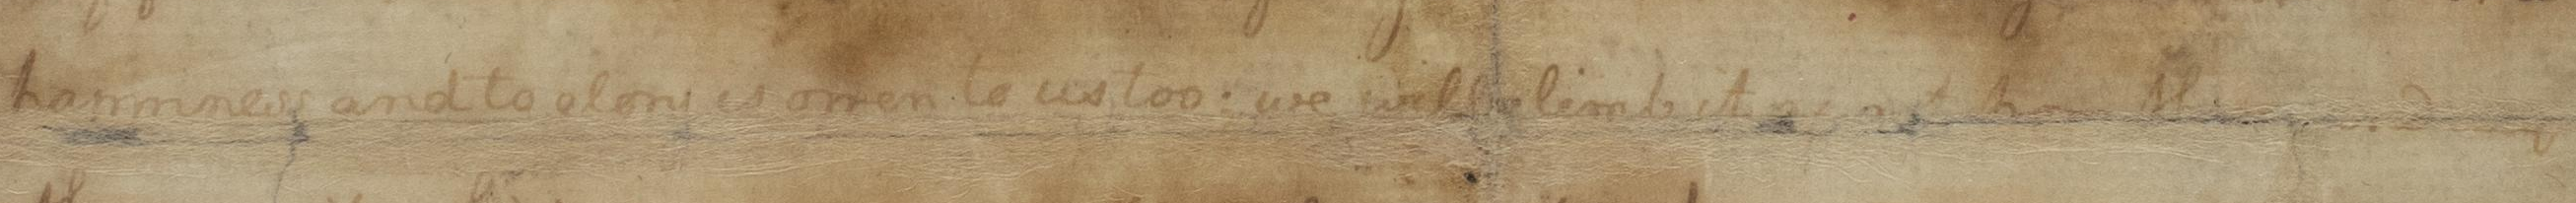to glory & happiness is open to us too; we will climb it in apart from them and
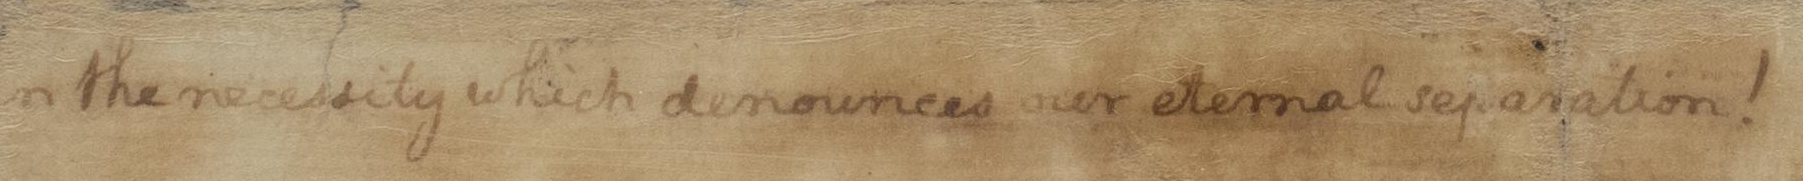the necessity which denounces our eternal separation
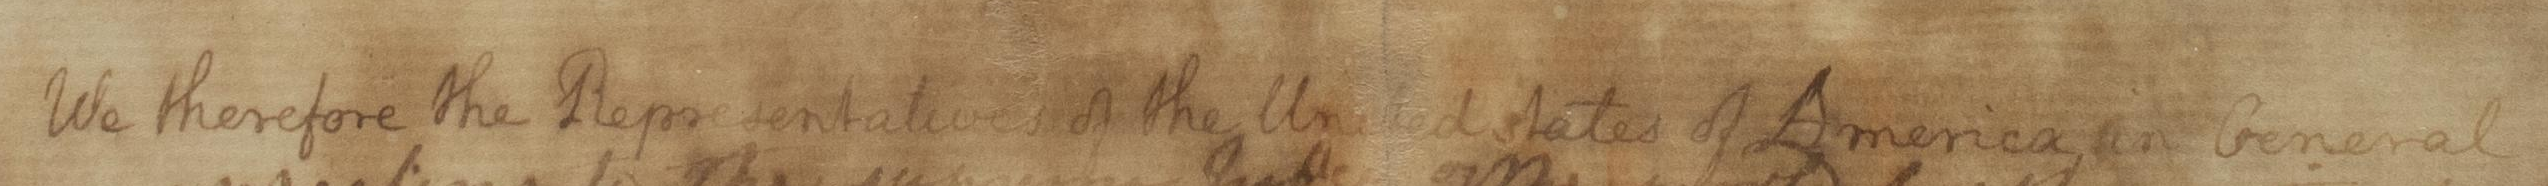We therefore the representatives of the United States of America in General
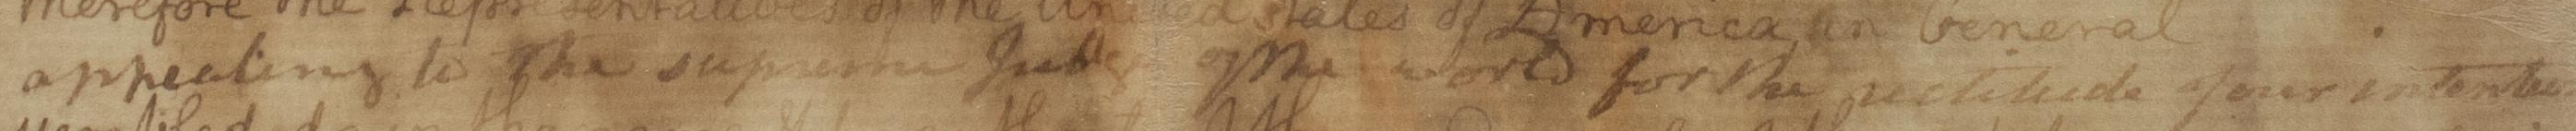appealing to the supreme God of the world for the rectitude of our intetntions
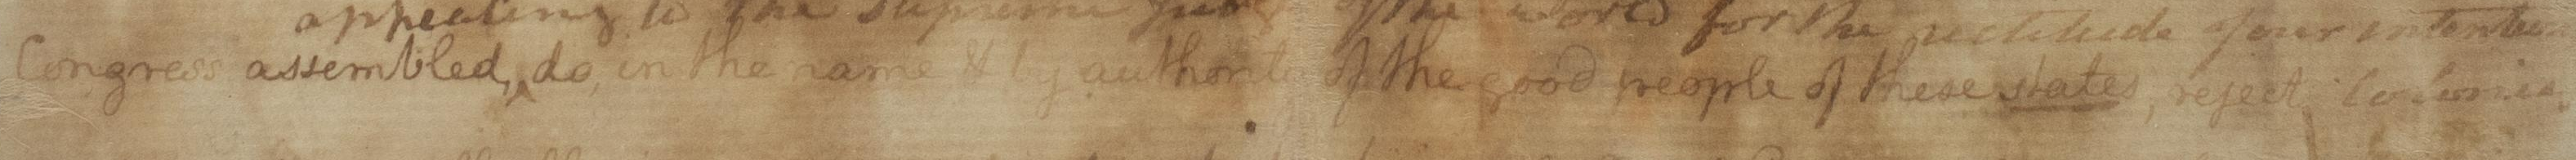Congress assembled, do in the name & by, author of the good people of these states, reject colonies
